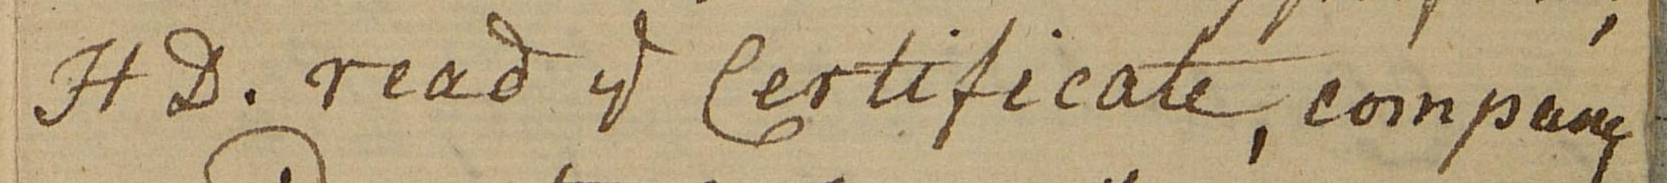HD. read y^e Certificate, company
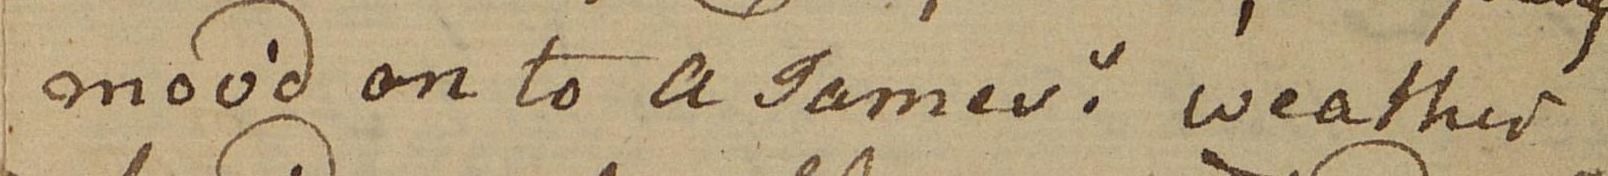mov'd on to A James^s. weather
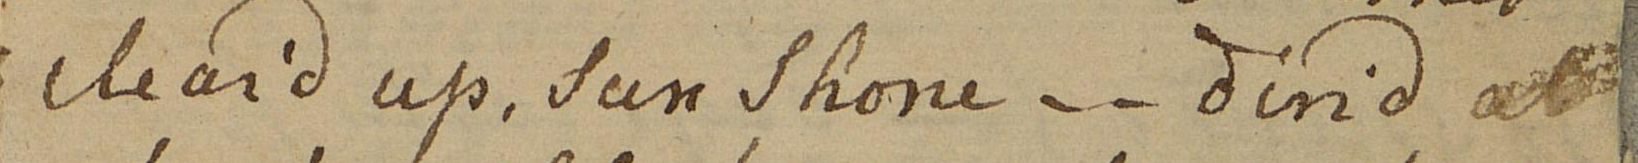clear'd up, Sun Shone-- din'd at
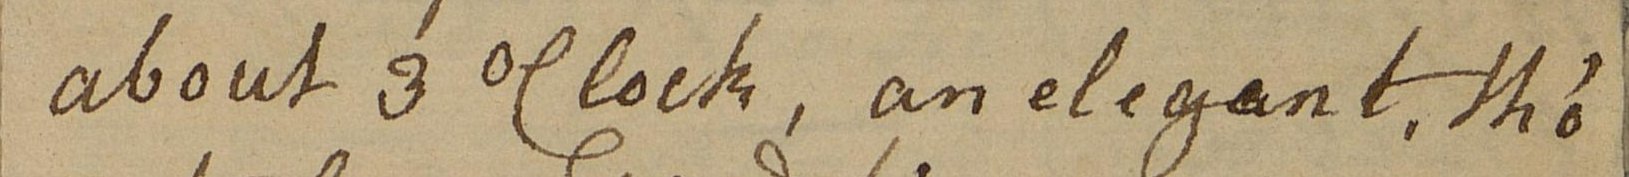about 3 ^o Clock, an elegant, tho'
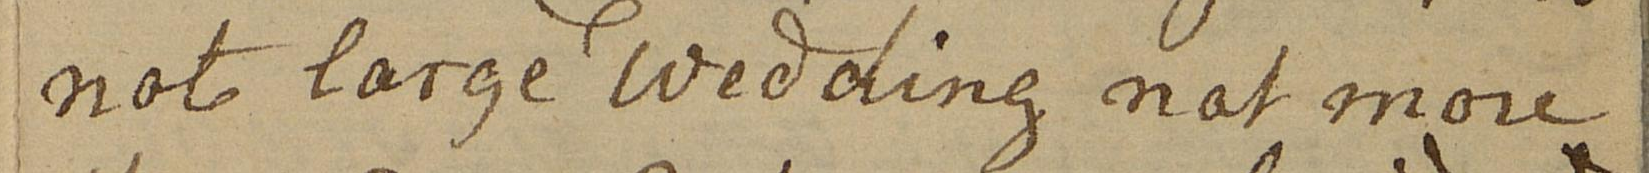not large wedding, not more
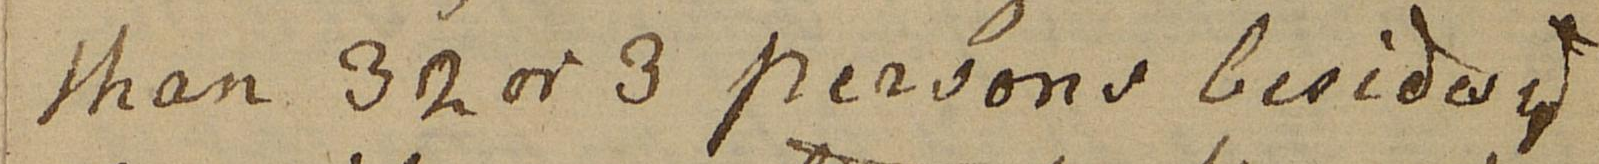than 32or 3 persons besides y^e
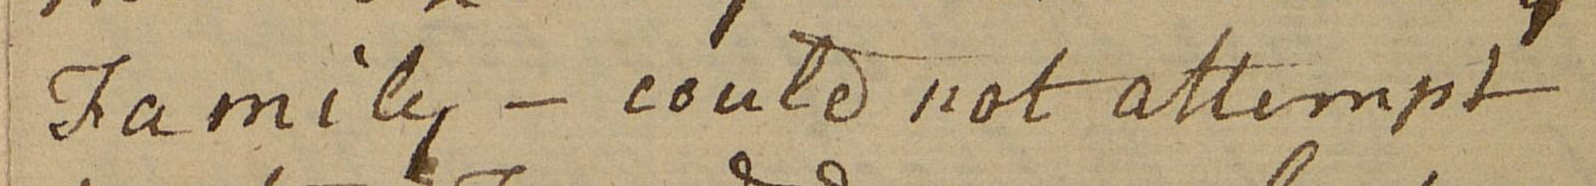Family- could not attempt
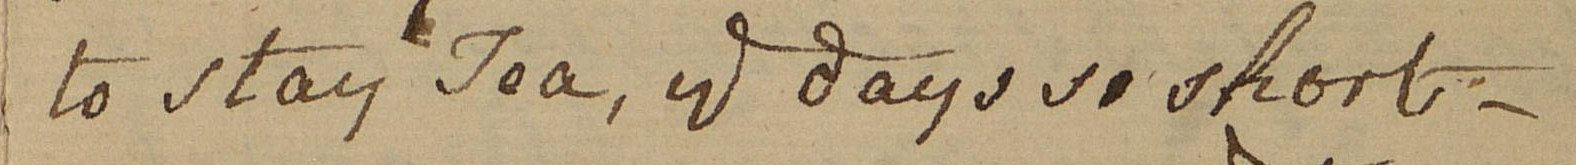to stay Tea, y^e days so short-
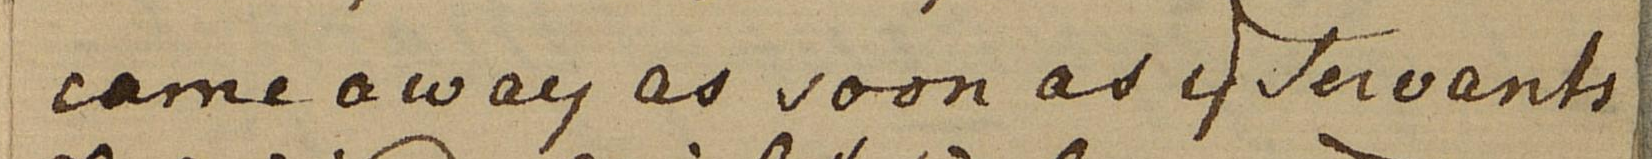came away as soon as y^e servants
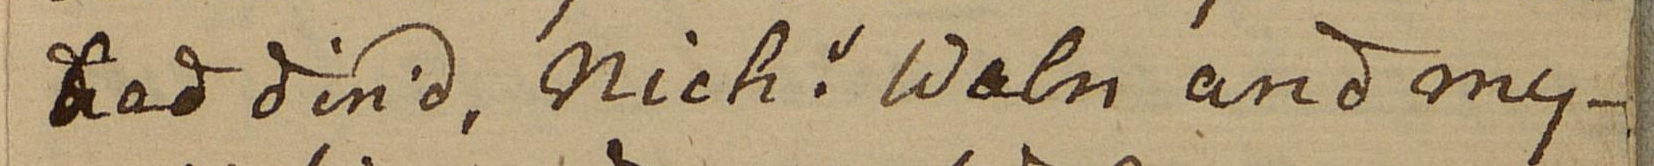had din'd, Nich^s Waln and my-
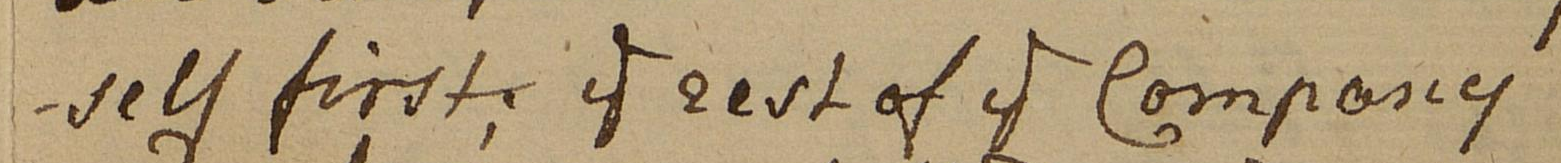-self first; y^e rest of y^e Company
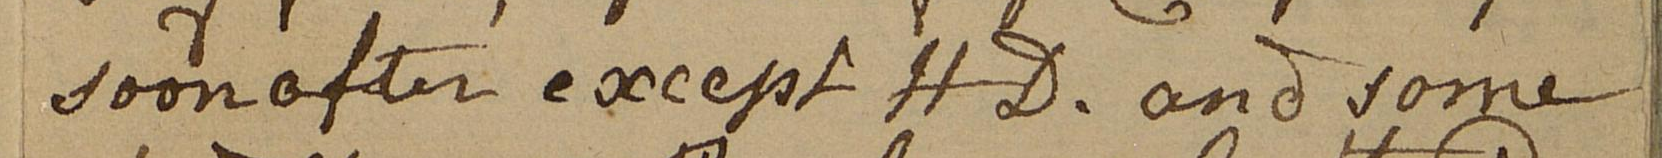soon after except HD. and some
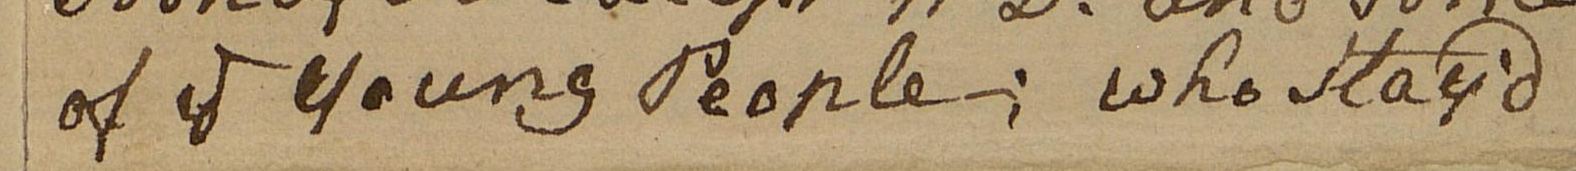of y^e young People; who stay'd
